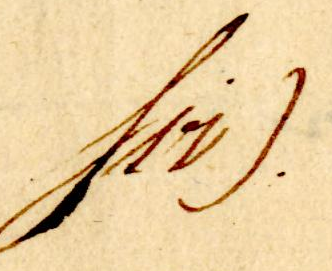Sir).
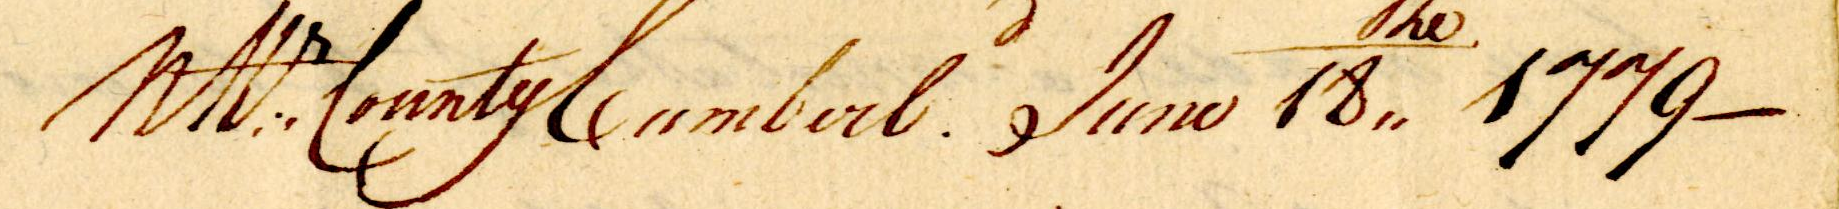NW. County Cumberl^d June 18^th. 1779-
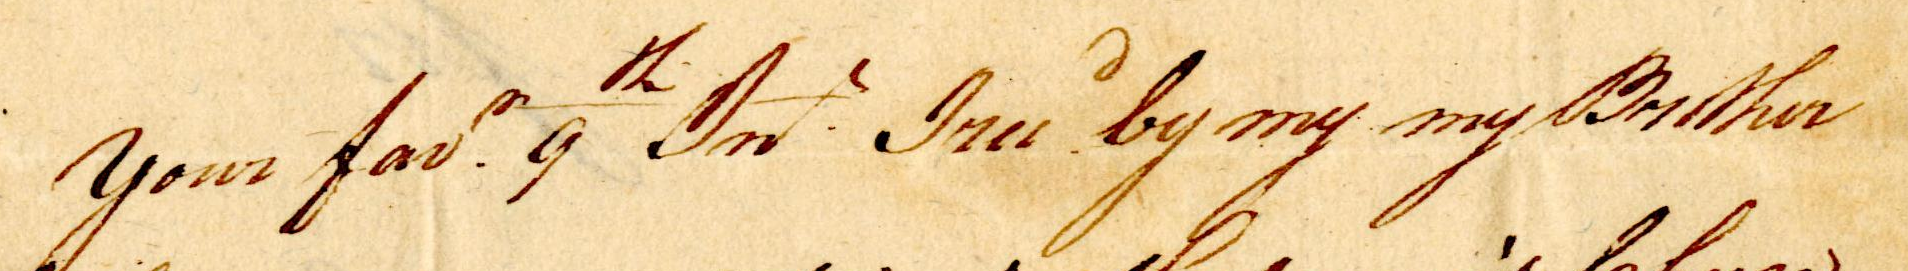Your fav^r. 9^th. In^t. I rec^d. by my my Brother
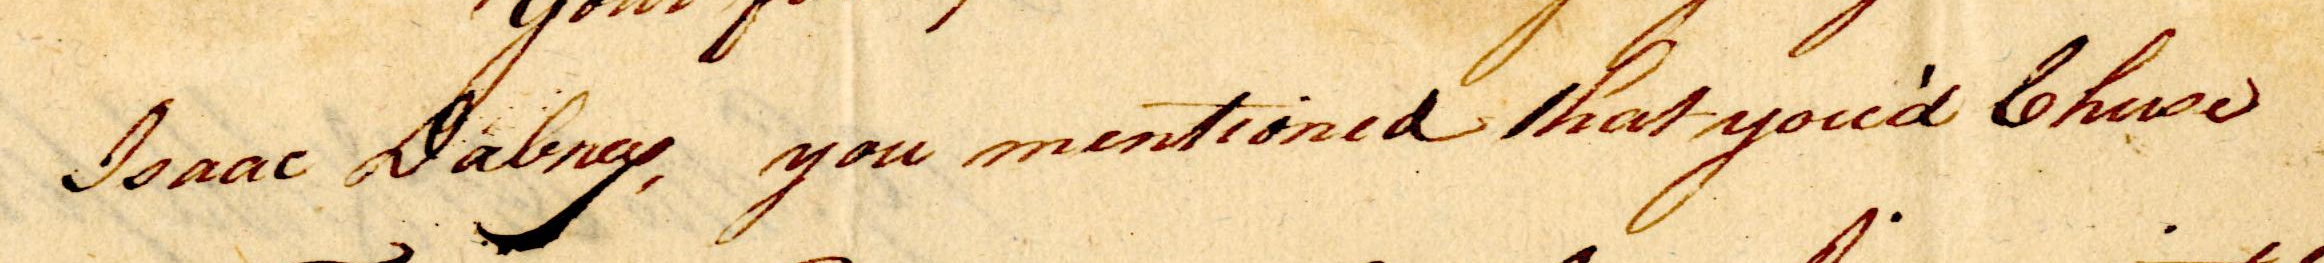Isaac Dabney, you mentioned that you'd Chuse
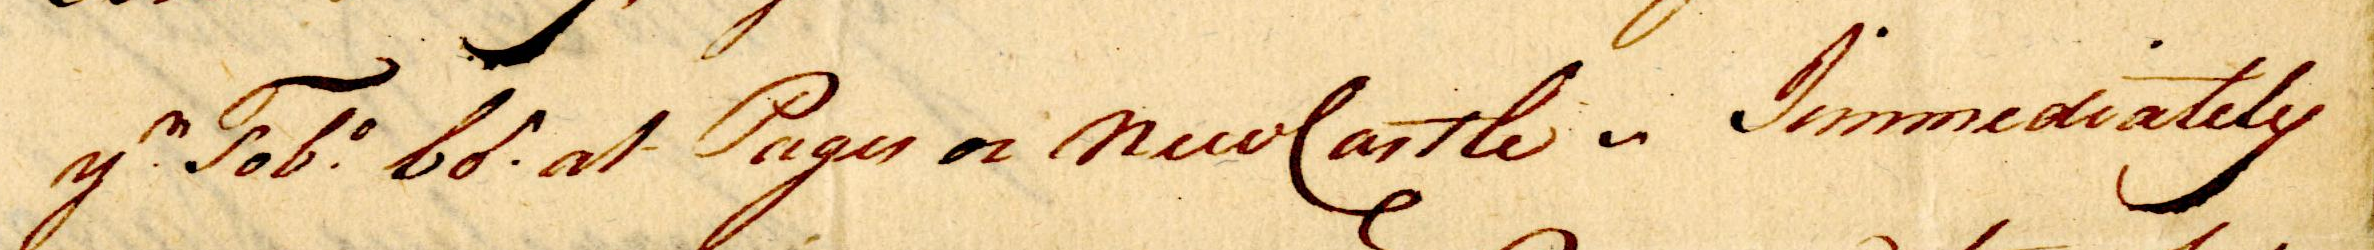y^r Tob^o Co. at Pages or new Castle. Immediately
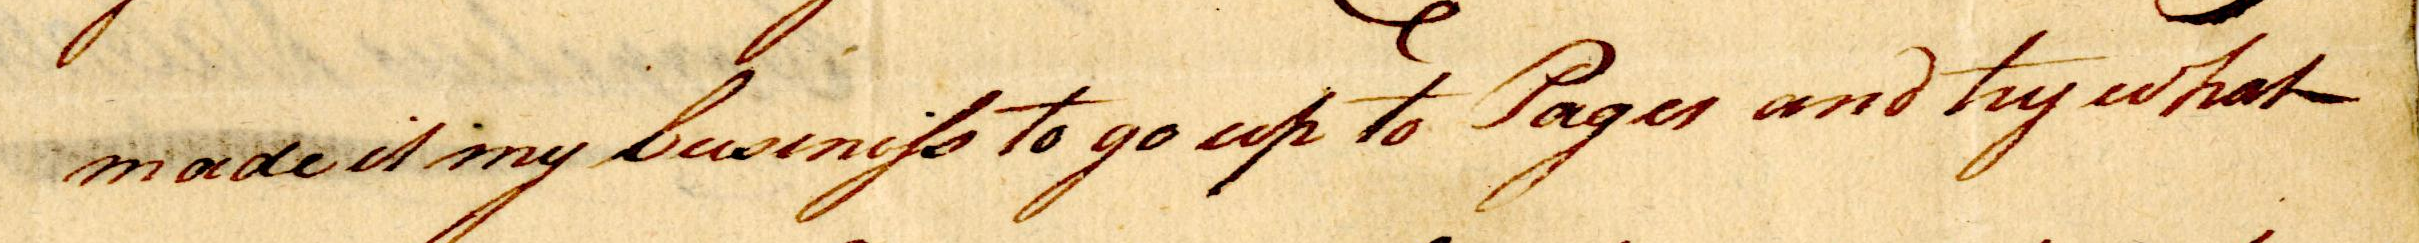made it my businiss to go up to Pages and try what
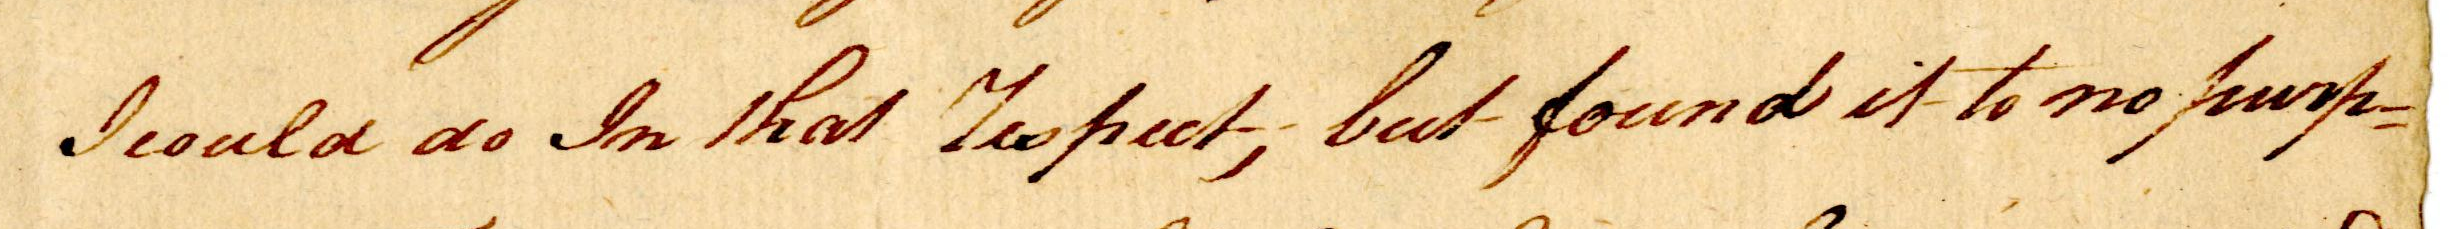I could do In that respect, but found it to no purp-
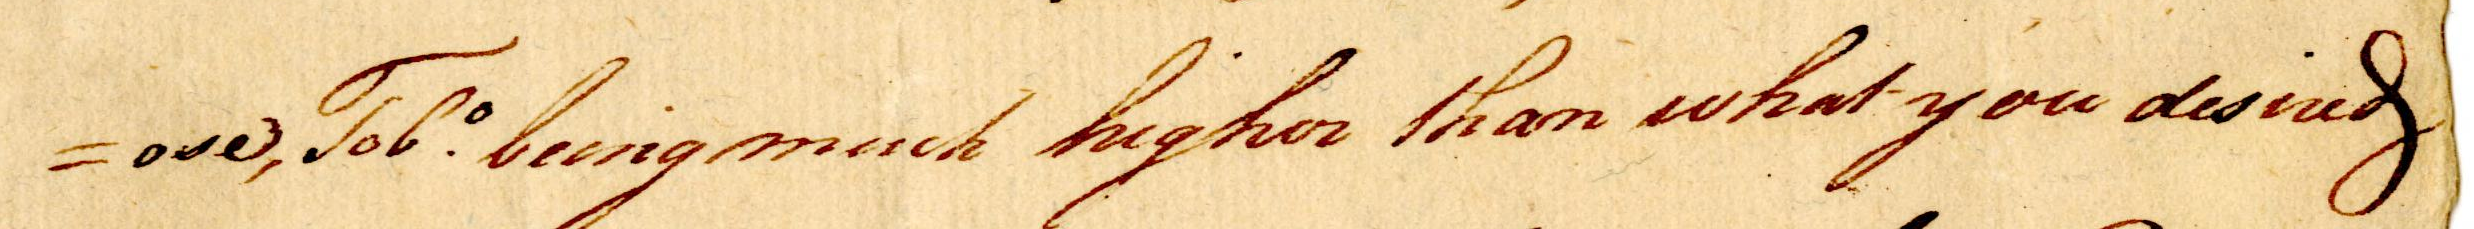-ose, Tob^o. being much higher than what you desired
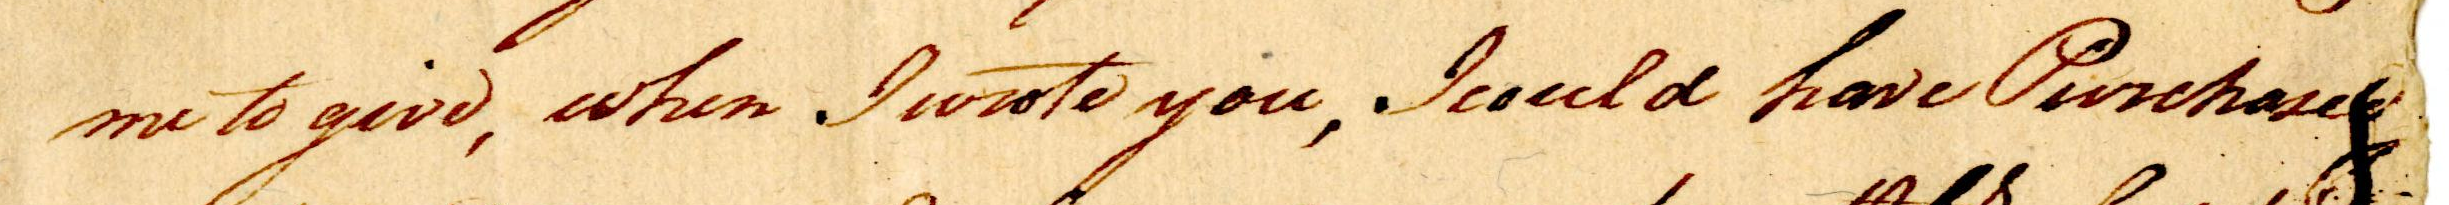me to give, when I wrote you, I could have Purchased
